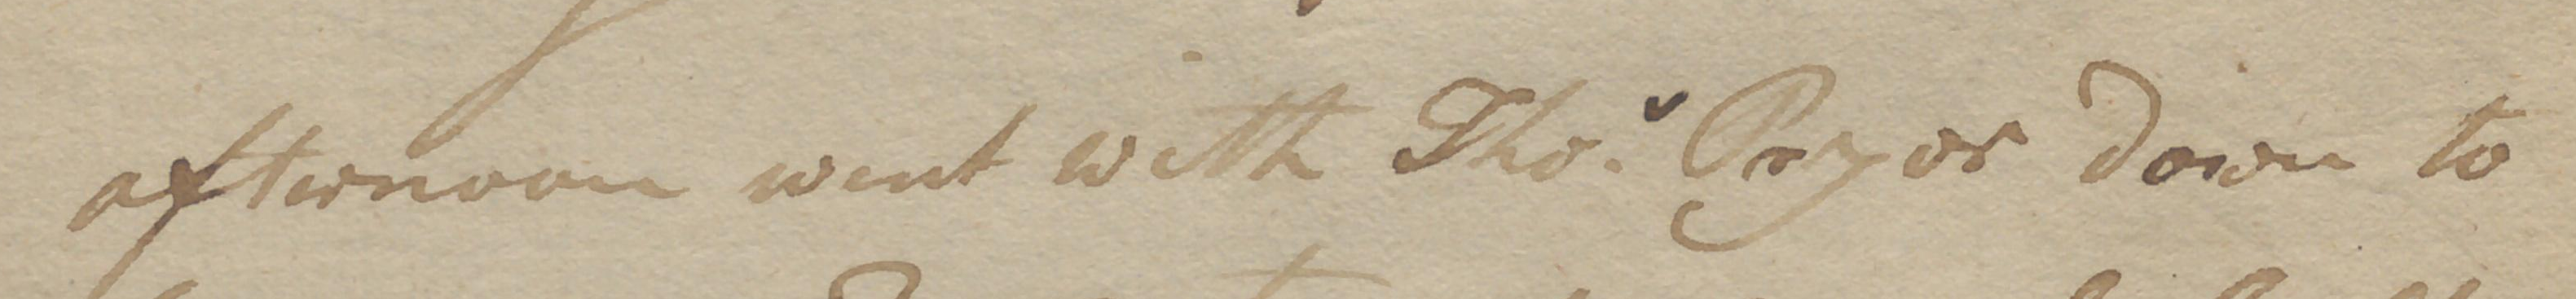afternoon went with Tho^s. Pryor down to
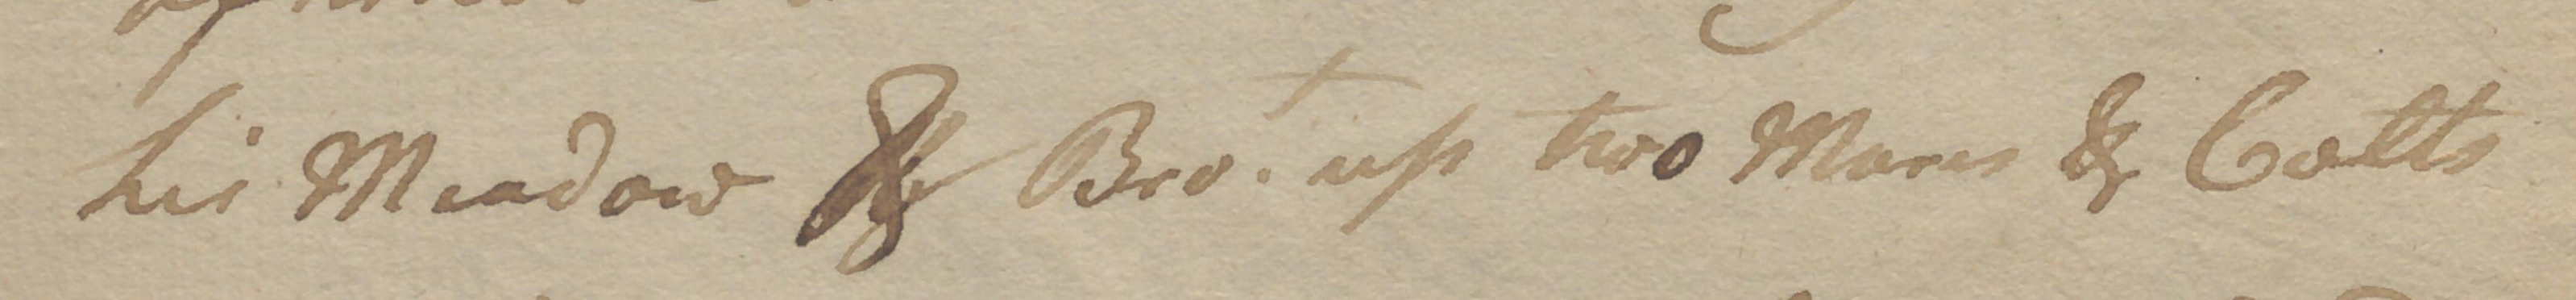his Meadow & Bro^t. up two Mares & Colts
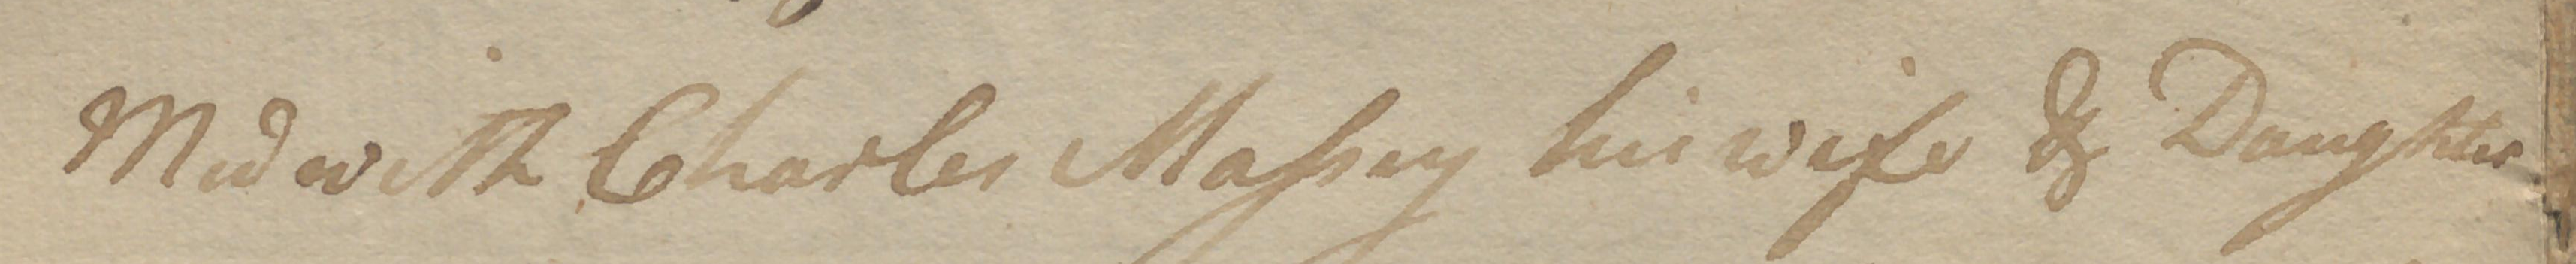Med with Charles Massey his wife & Daughter
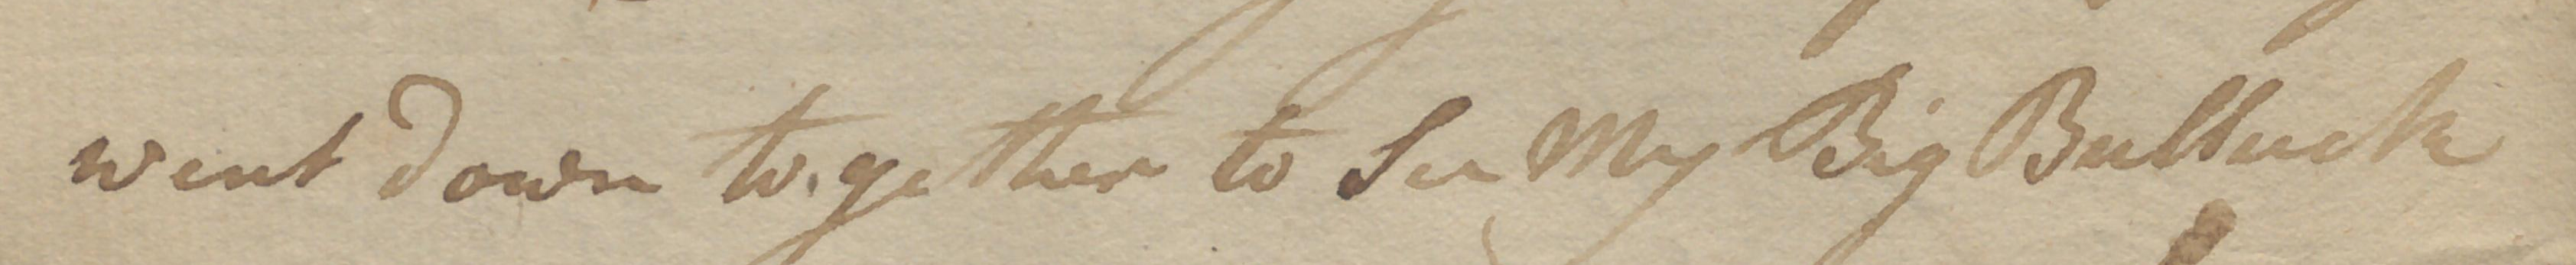went down to gether to See My Big Bulluck
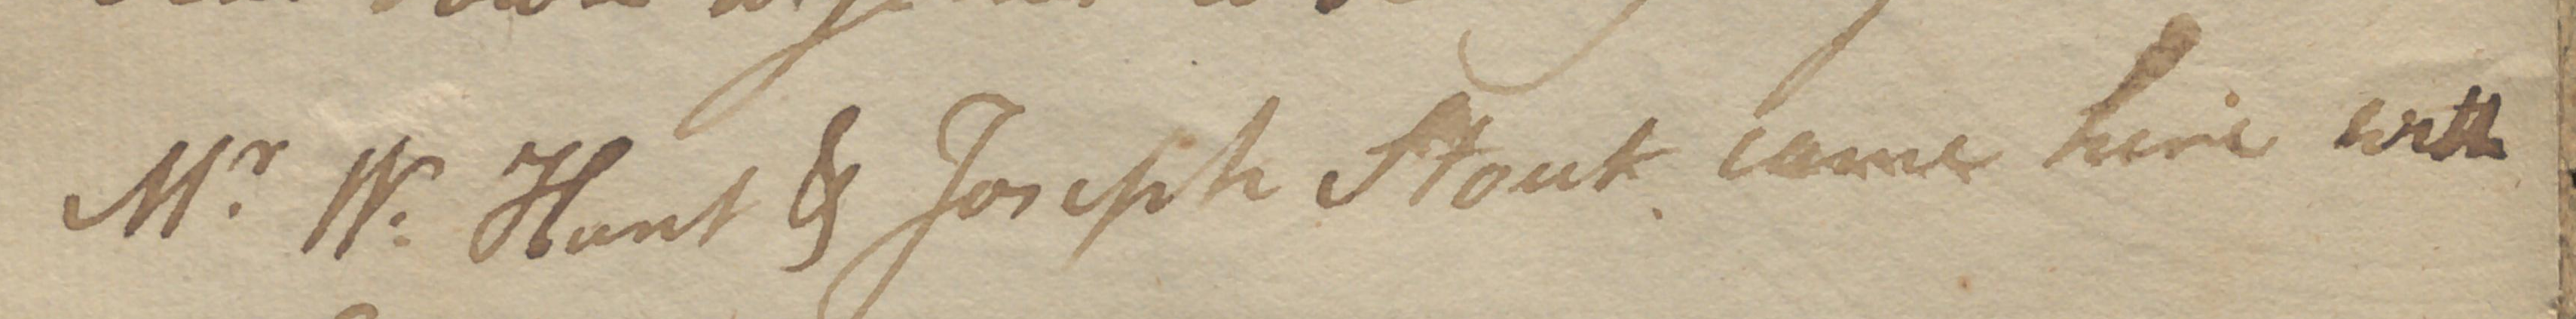M^r. W. Hunt & Joseph Stout came here with
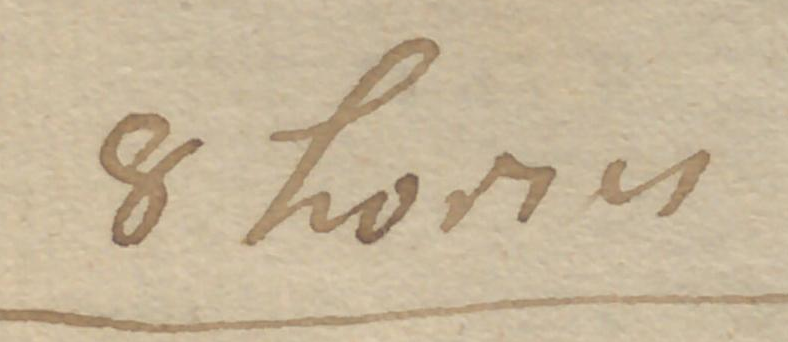8 horses
